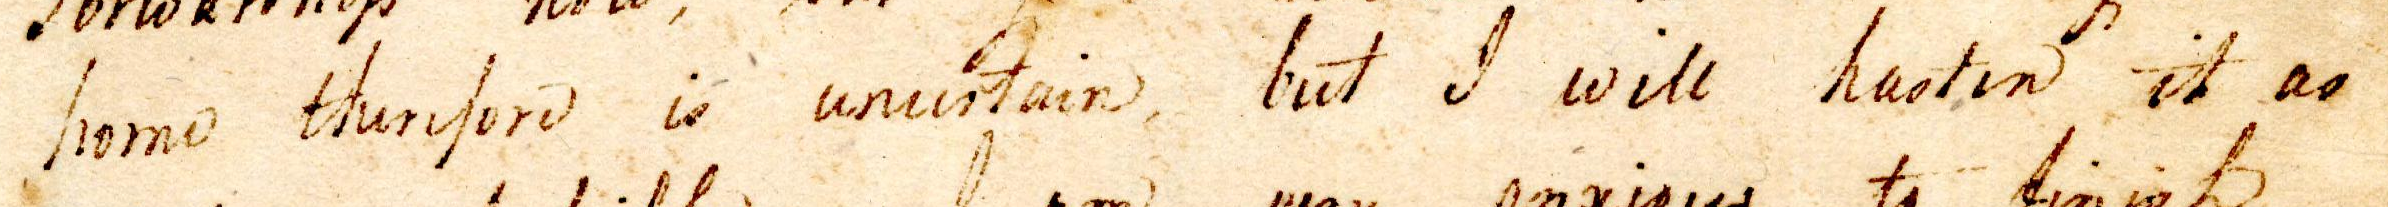home therefore is uncertain, but I will hasten it as
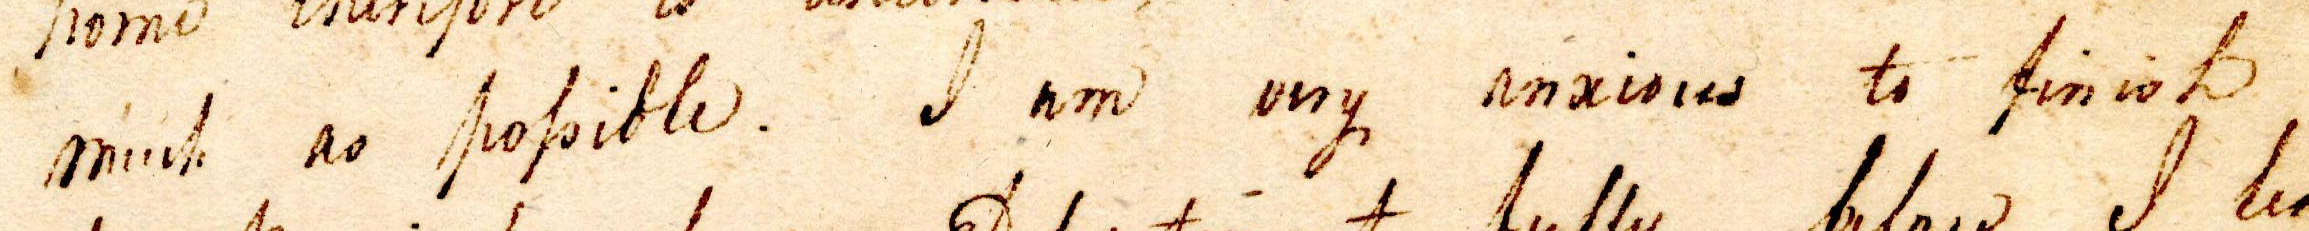much as possible. I am very anxious to finish
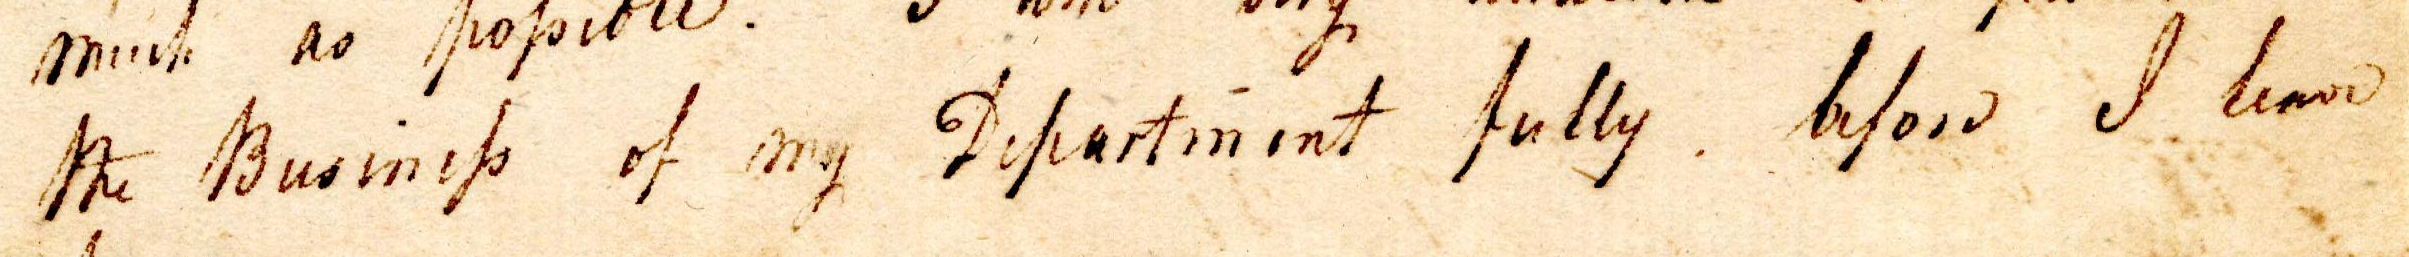the Business of my Department fully before I leave
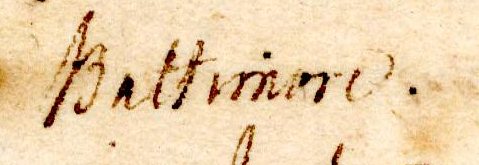Baltimore.
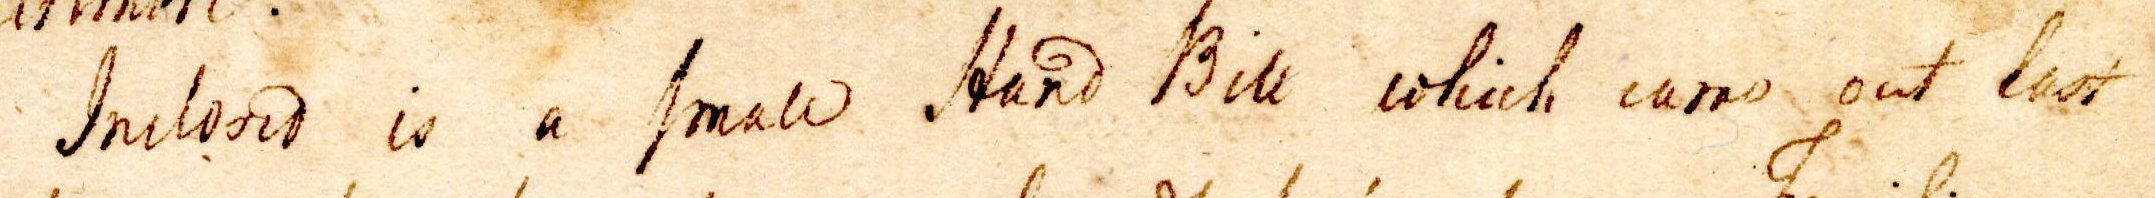Inclosed is a small Hand Bill which came out last
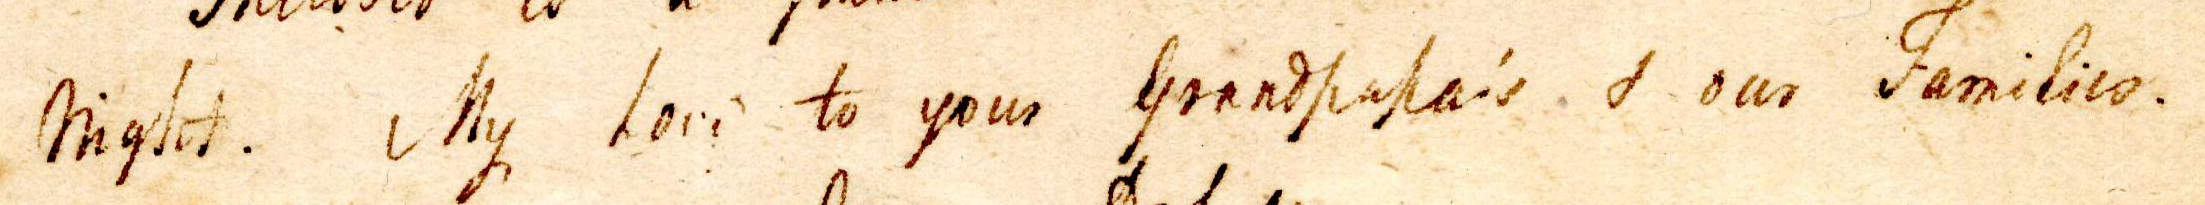Night. My Love to your Grandpapa's & our Families.
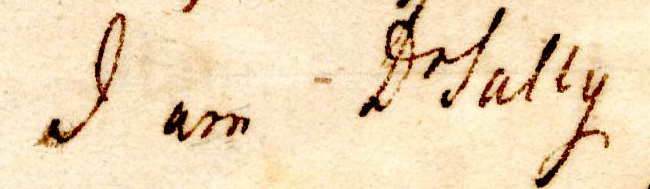I am D^r Sally
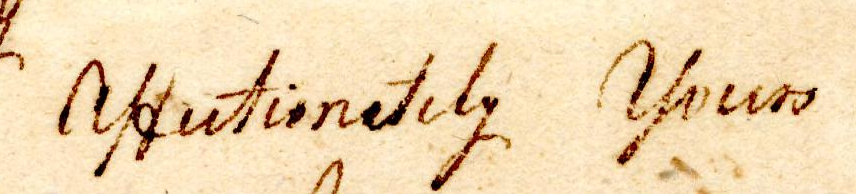Affectionately Yours
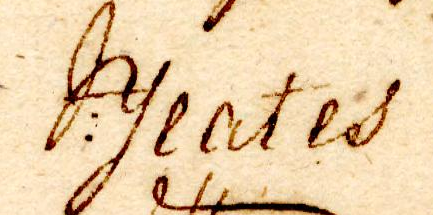J. Yeates
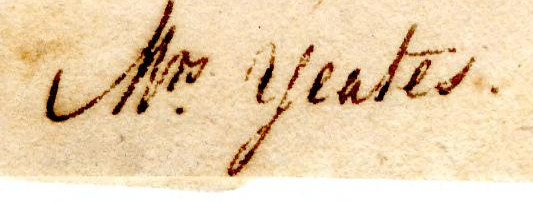M^rs. Yeates.
